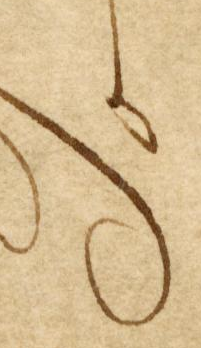To
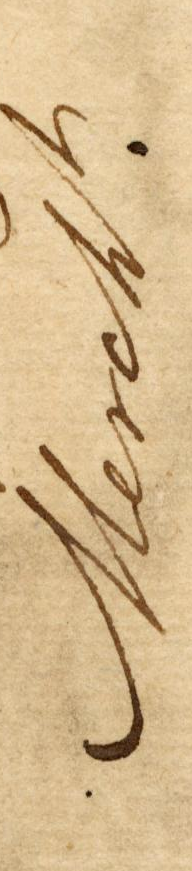Merch^t.
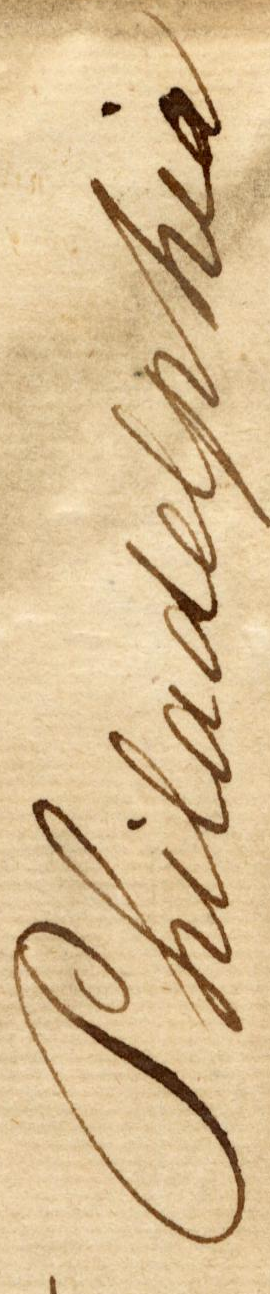Philadelphia
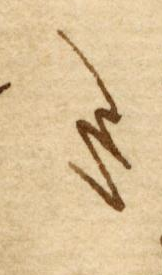in
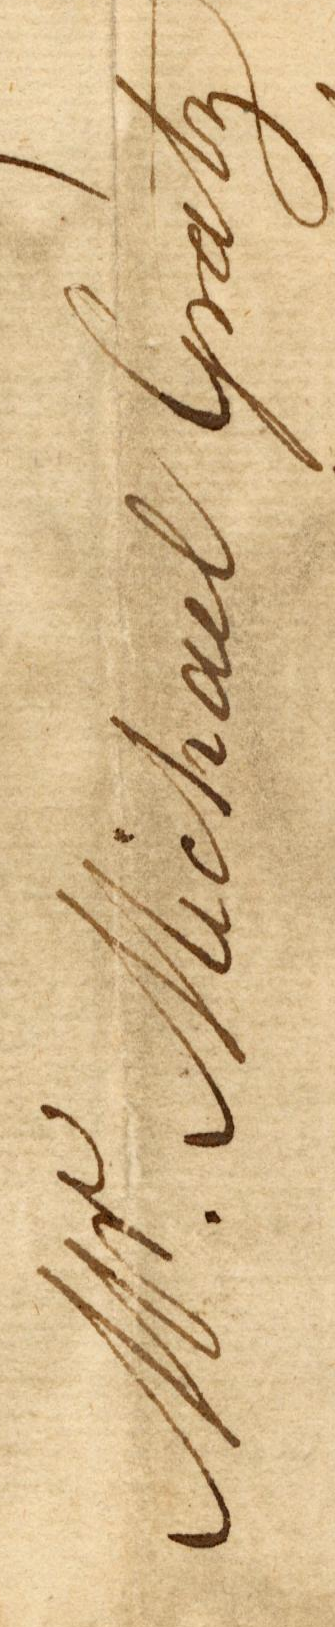M^r. Michael Gratz
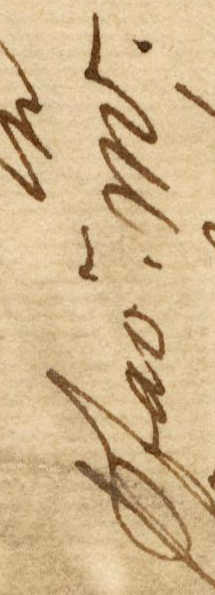Fav^r. Mr.
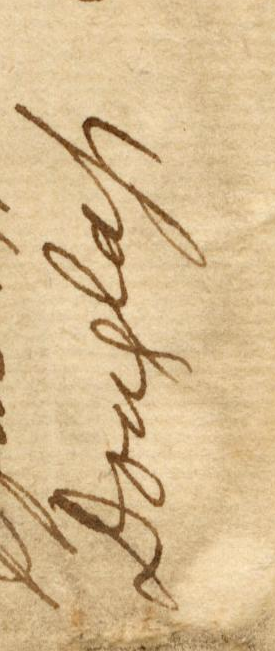Douglass
